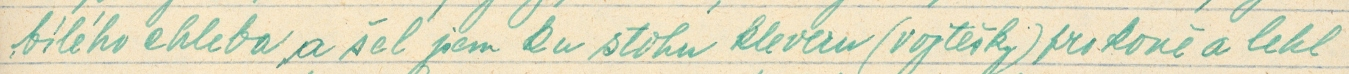bílého chleba a šel jsem ku stohu kleveru (vojtěšky) pro koně a lehl
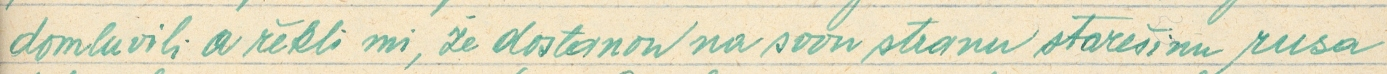domluvili a řekli mi, že dostanou na svou stranu starešinu rusa
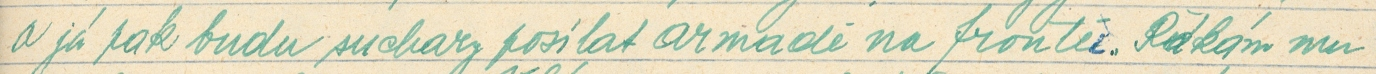a já pak budu suchary posílat armadě na frontu. Říkám mu
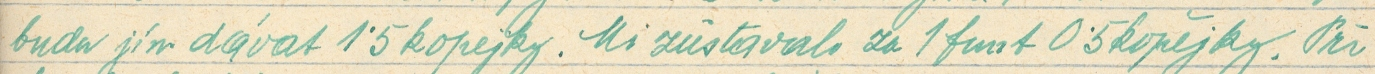budu jím dávat 1.5 kopejky. Mi zůstavalo za 1 funt 0.5 kopějky. Při
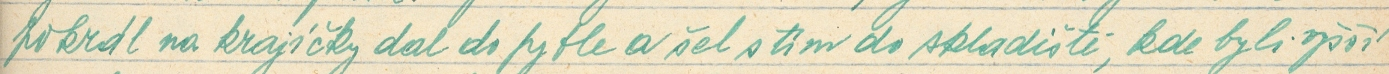pokrál na krajíčky dal do pytle a šel s tím do skladiště, kde byli vyšší
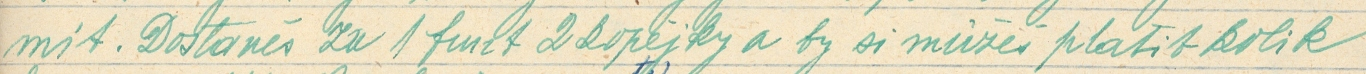mít. Dostaneš za 1 funt 2 kopějky a ty si můžeš platit kolik
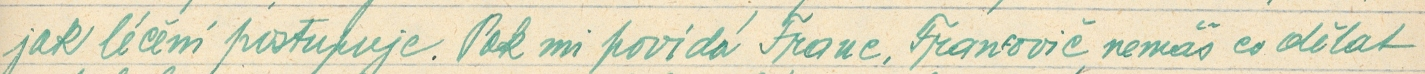jak léčení postupuje. Pak mi povídá Franc, Francovič, nemáš co dělat
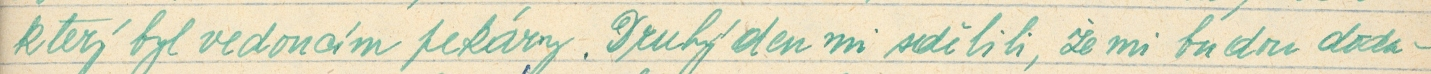který byl vedoucím pekárny. Druhý den mi sdělili, že mi budou doda-
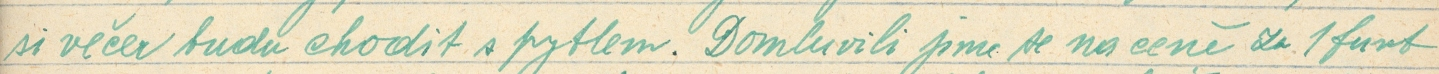si večer budu chodit s pytlem. Domluvili jsme se na ceně za 1 funt
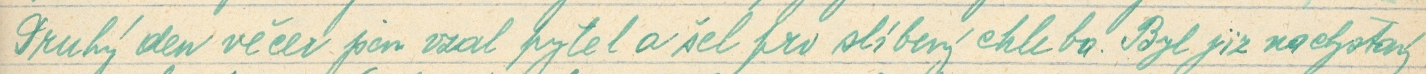Druhý den večer jsem vzal pytel a šel pro slíbený chleba. Byl jiz nachystaný.
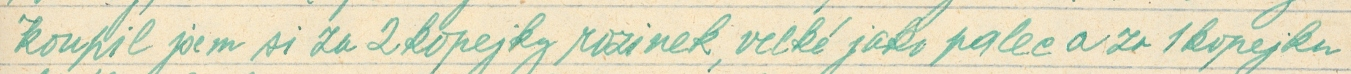koupil jsem si za 2 kopejky rozinek, velké jako palec a za 1 kopejku
